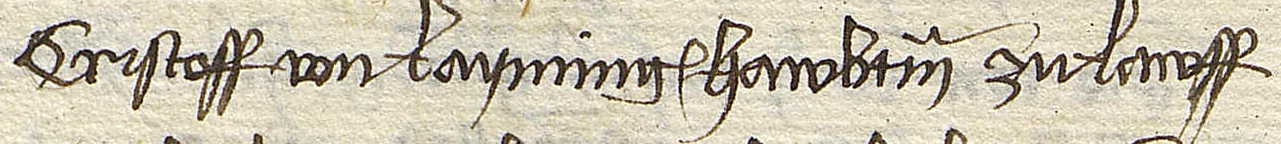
Criſtoff von layming* Hawbtm* ʒu Lawff
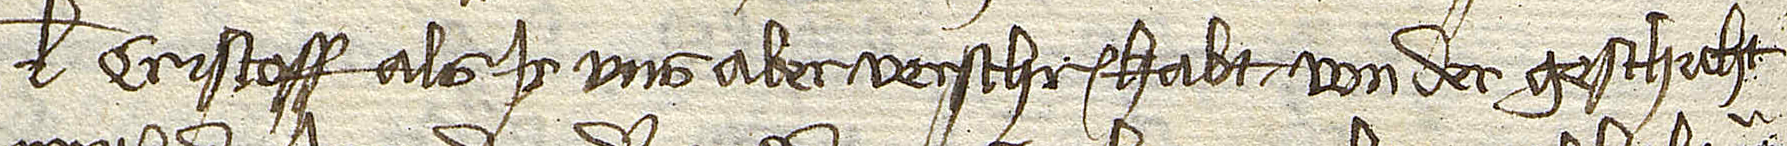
L* Criſtoff als Ir vns aber verſchr* habt / von der geſchicht
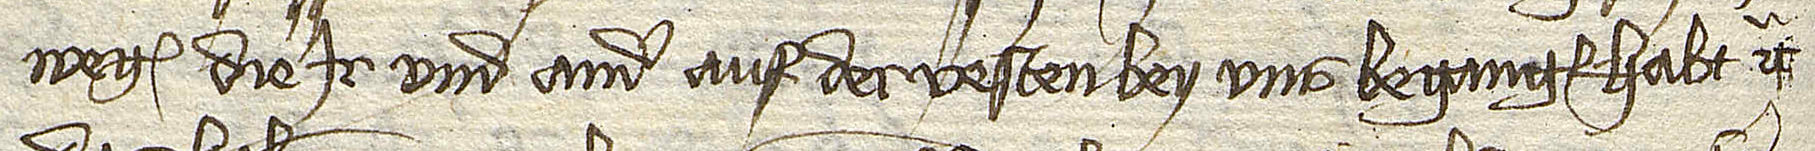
weg* die Ir vnd and* auf der veſten bey vns begang* habt ec*
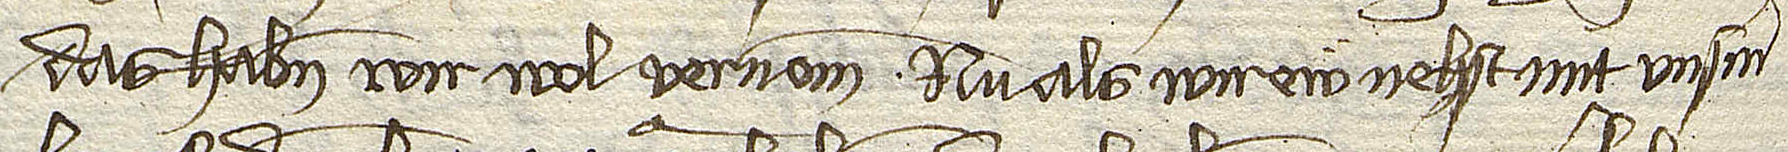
/ Das habn* wir wol vernom* . Nu als wir eẅ nehſt mit vnſm*
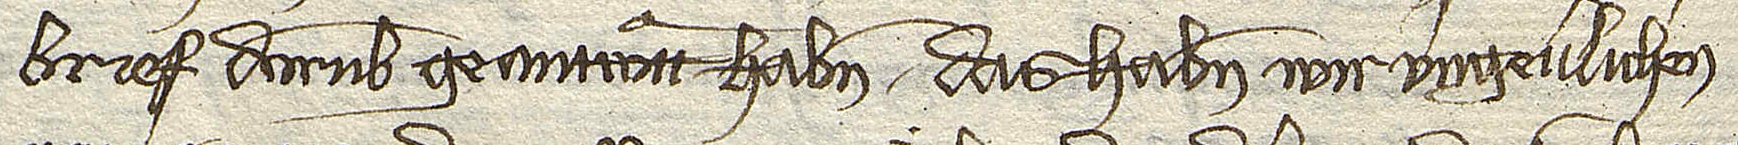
brief darub* geantw*tt habn* / Das habn* wir vngeu*lichen
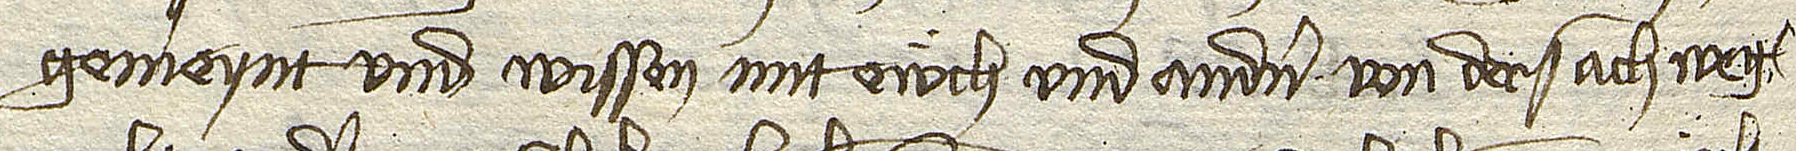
gemeynt vnd wiſſen mit eẅch vnd andn* . von der ſach weg*
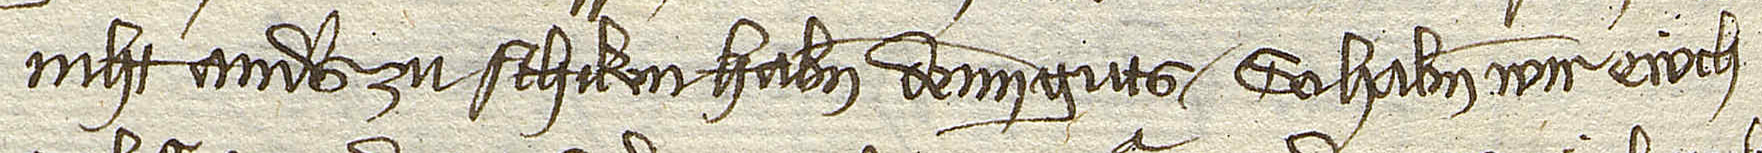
niht and*s ʒu ſchiken habn* denn guts / So habn* wir eẅch
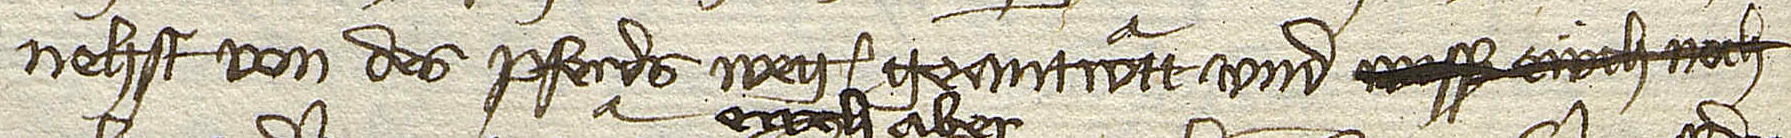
nehſt von des pferds weg* geantw*tt / vnd wiſſ* eẅch noch
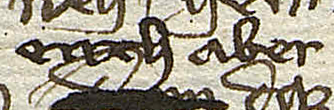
eẅch aber
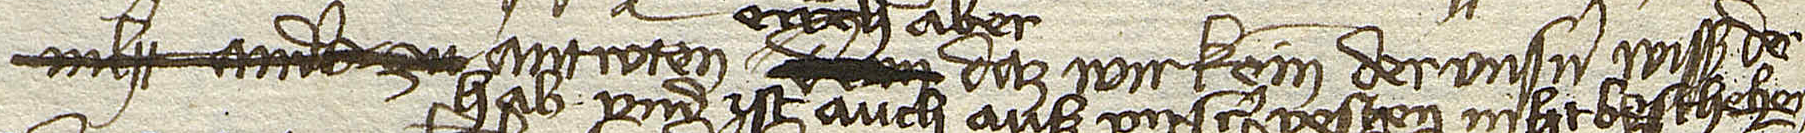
niht and*s ʒu antw*ten / Denn daʒ wir kein* der vnſn* wiſſ* der
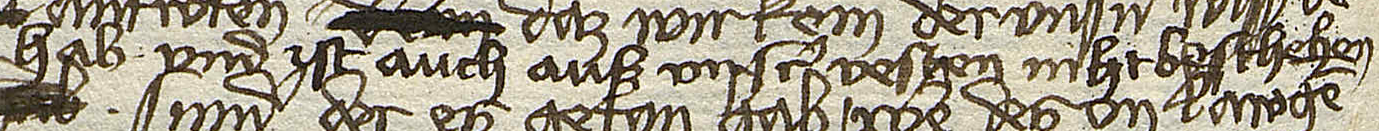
hab vnd iſt auch auſʒ vnſr* veſten niht beſchehen
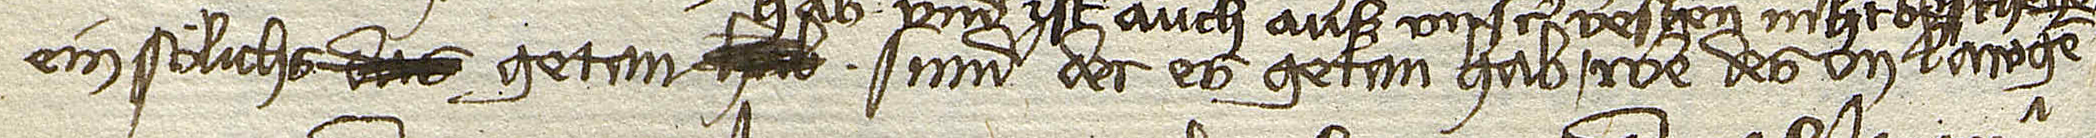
ein ſölichs das getan hab . ſund* der es getan hab / w*e des on lawge*
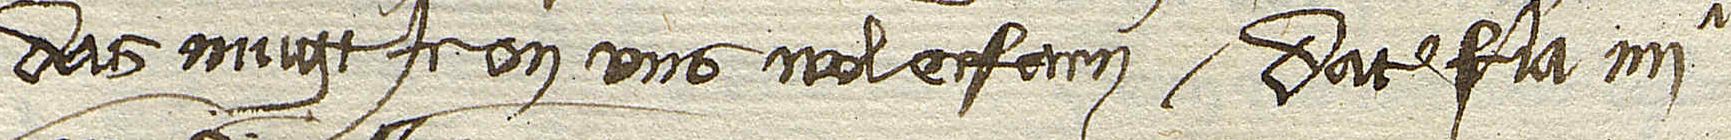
Das mugt Ir on vns wol erfarn / Dat* fi*a iiii*
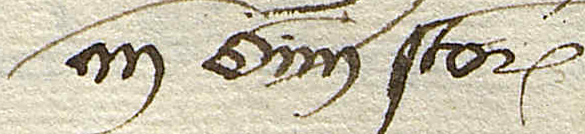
an* Omi* ſco*
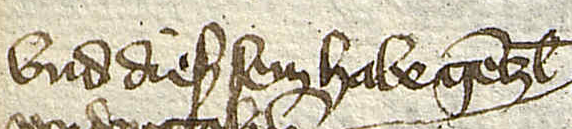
vnd dieſ* ſein habe ge*cʒl*
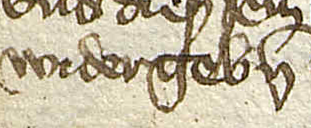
widergebn*
